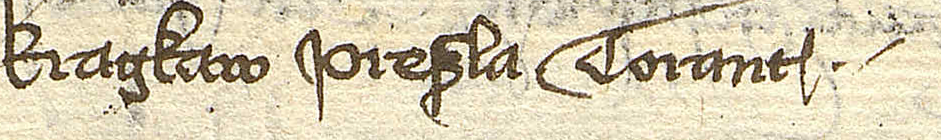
Kragkaw Preſʒla Torant* . /
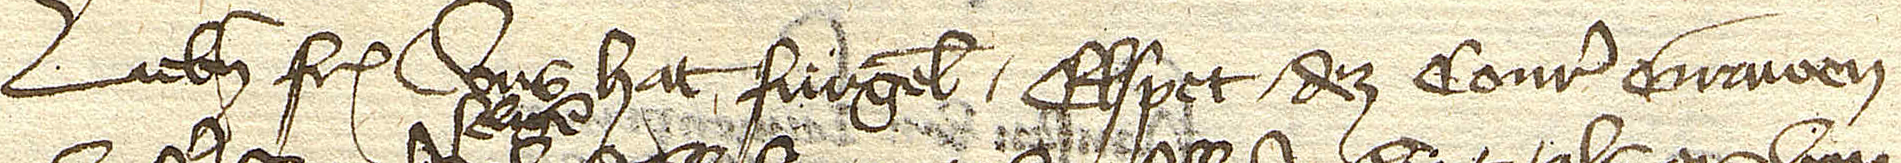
Liebn* fr* / Vns hat fürgel* / Elſpet / deʒ Conr* Grawen
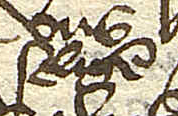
ſelige*
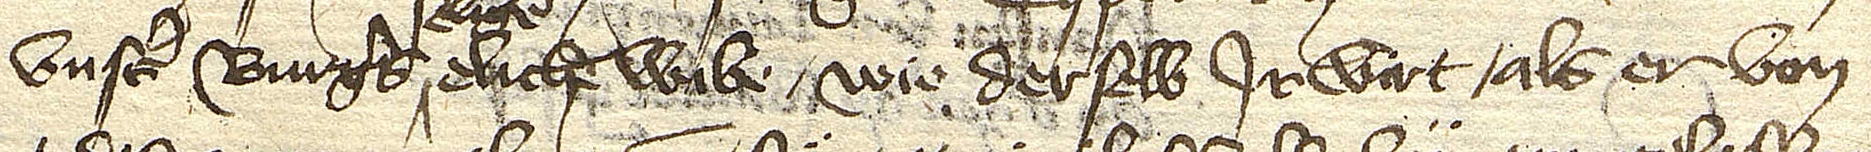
vnſs* Burg*s eliche wibe / wie derſelb Ir wirt / als er von
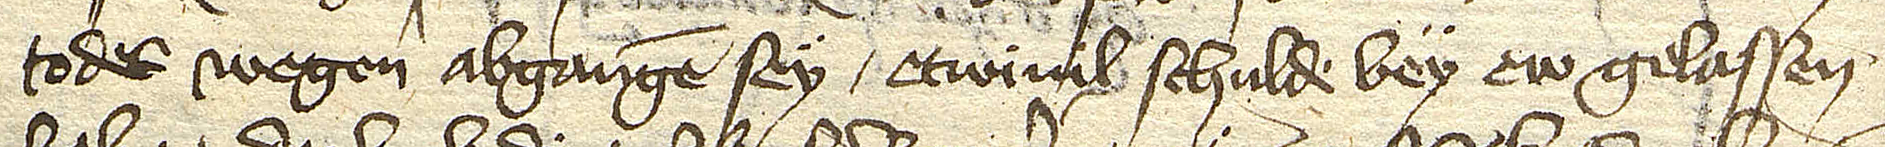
tode wegen abgange* ſey / etwiuil ſchulde bey ew gelaſſen
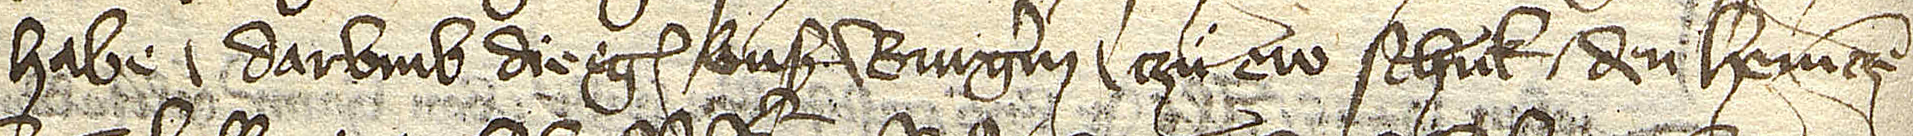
habe / darvmb die eg* vnſ* Burgin* / cʒü ew ſchick / den heincʒe*
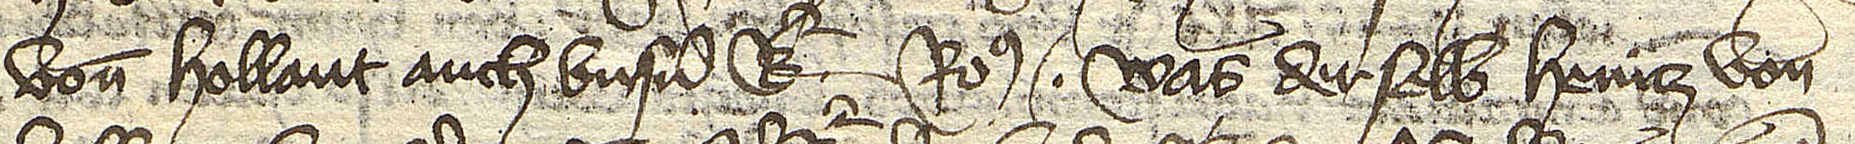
von hollant auch vnſn* B* . Ro* /. was der ſelb heincʒ von
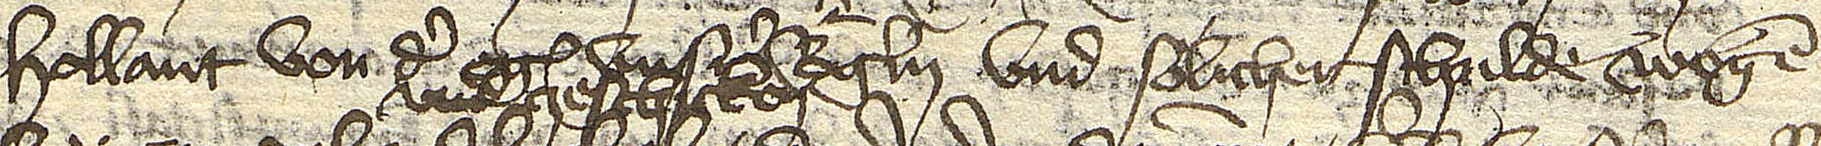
hollant von d* eg* vnſr* B*g*in vnd ſölicher ſchulde wege*
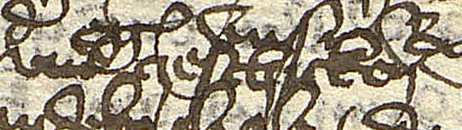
vnd cʒeſchicken
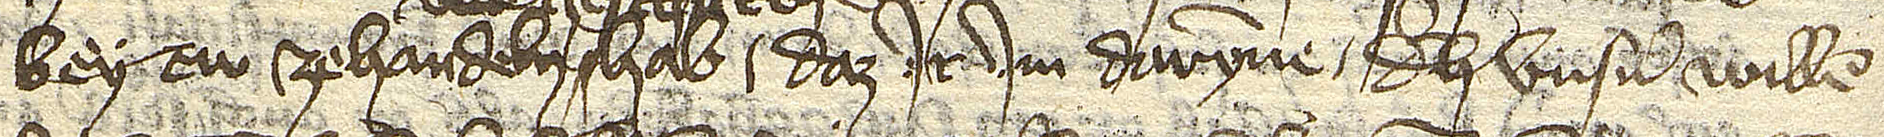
bey ew cʒehandeln hab / daʒ Ir Im daryne* / d*h vnſn* wille*
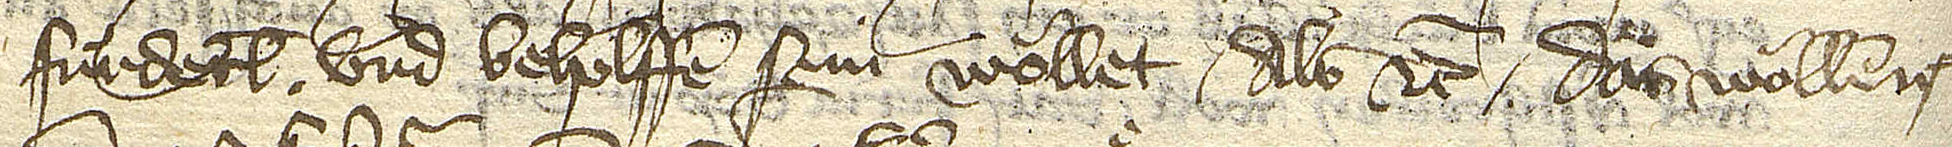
fürderl* . vnd beholffe* ſein wöllet / Als ec* / das wölle* ec*
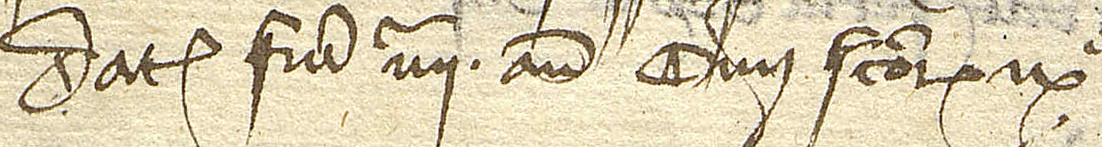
Dat* fia* iiii* . an* Omi* ſcor* ix*
